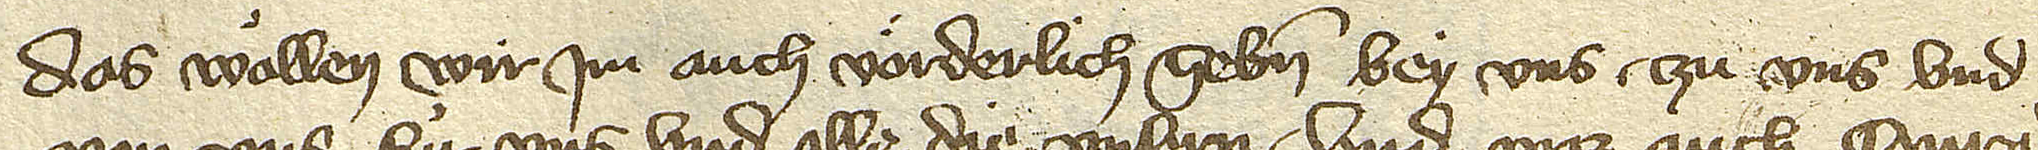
das wöllen wir Im auch vörderlich gebn* bey vns / cʒu vns vnd
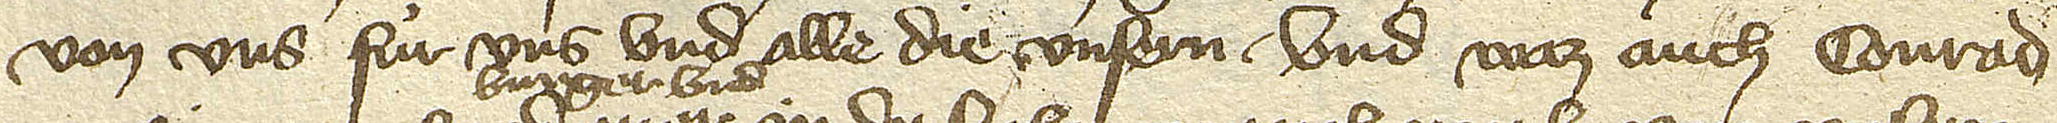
von vns für vns vnd alle die vnſern / vnd waʒ auch Conrad
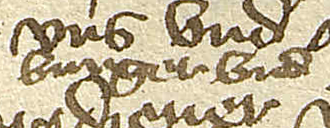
burger vnd
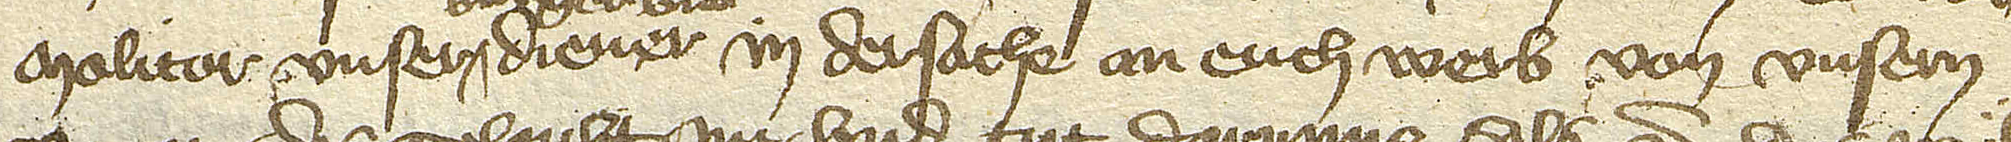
Molitor vnſer diener in derſache an euch werb von vnſern
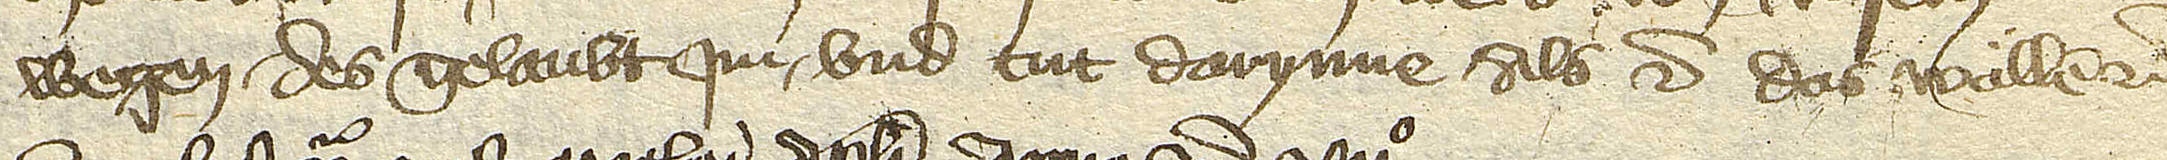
wegen / des gelaubt Im / vnd tut darynne / Als ec* das wölle* ec*
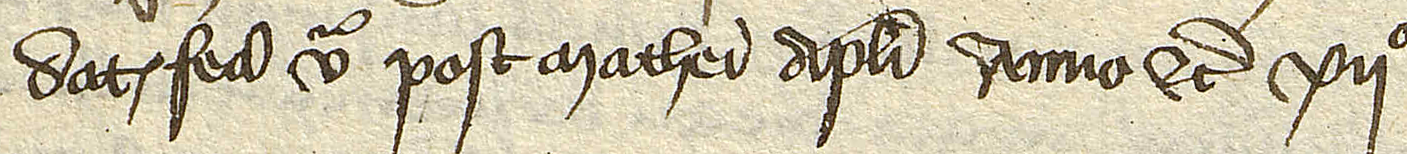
dat* fea* v* poſt Mathei* Apli* Anno ec* xii*
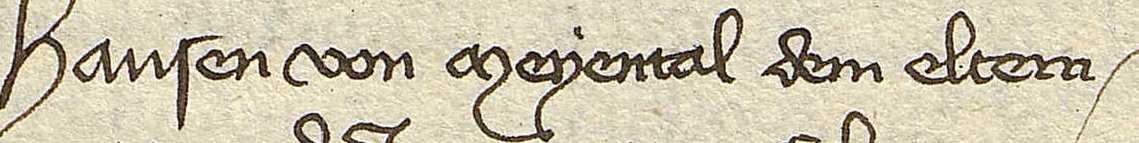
Hanſen von Meyental dem eltern /
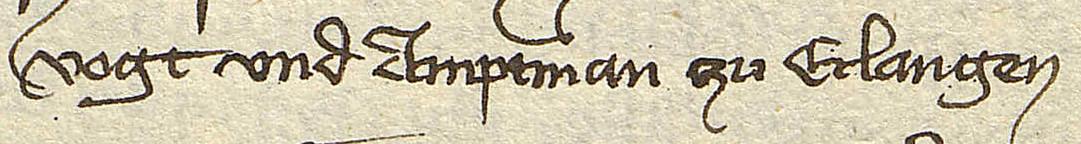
vogt vnd Amptman cʒu Erlangen
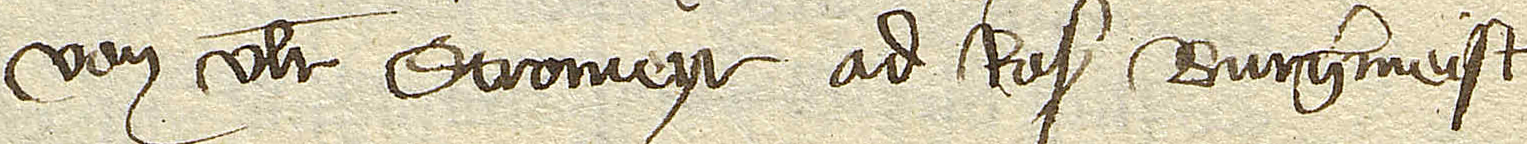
von vlr* Stromeyr ad Roſ* Burg*meiſt*
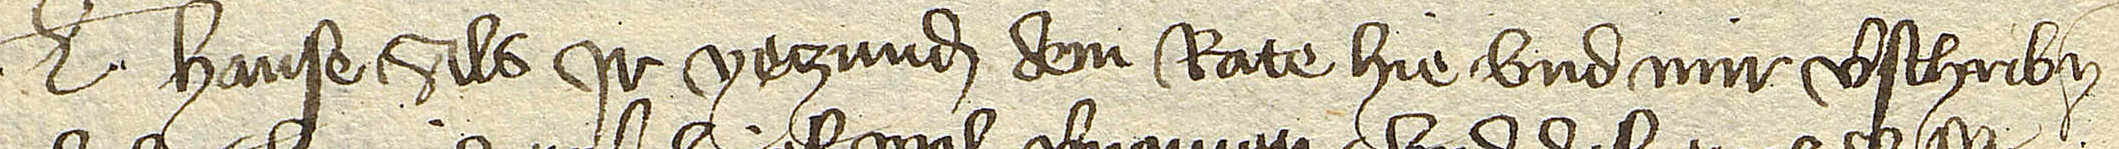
L* Hanſe / Als Ir yecʒund* dem Rate hie / vnd mir v*ſchribn*
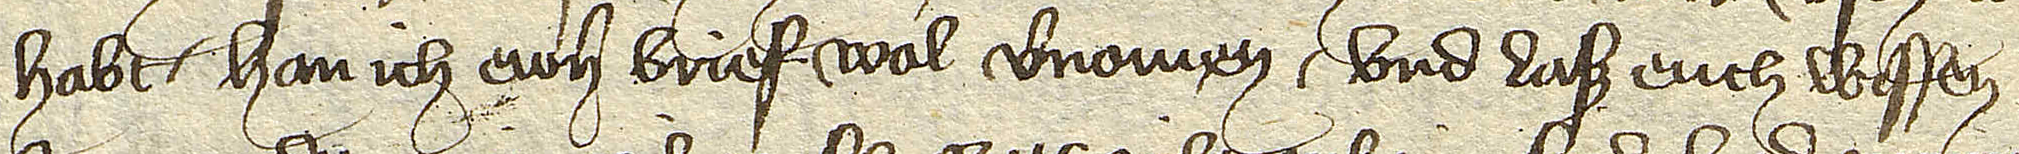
habt / han ich ewn* brief wol v*nomen / vnd laſʒ euch wiſſen
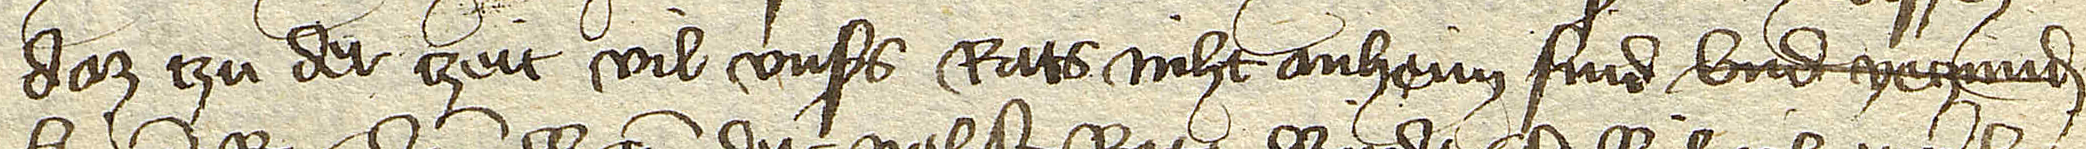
daʒ cʒu der cʒeit vil vnſ*s Rats niht anheim ſind / vnd yecʒund*
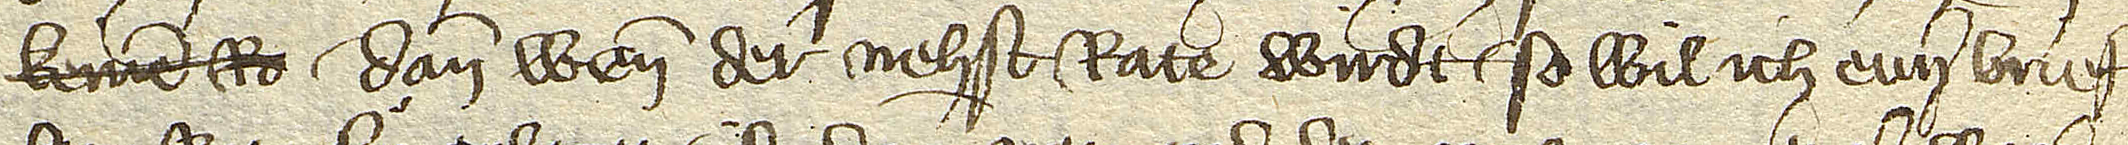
keine* Ra / dan* wen* der nehſt Rate wirdt / ſo wil ich ewn* brief
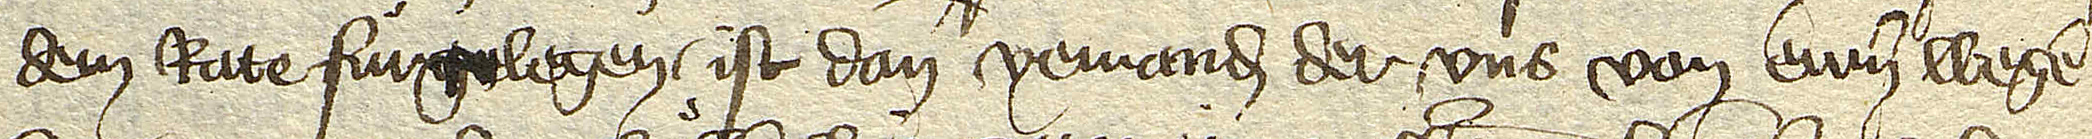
dem Rate fürgelegen / iſt dan* yemand* der vns von ewn* wege*
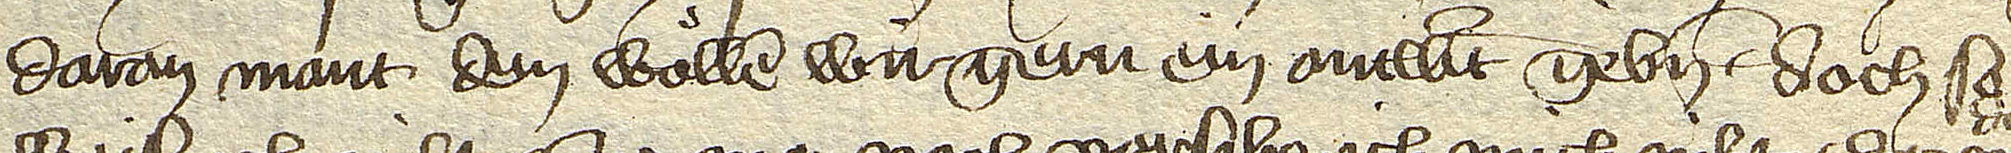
daran mant dem wölle* wir gern ein antwt* gebn* / doch ſo
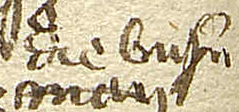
die vnſ*n
